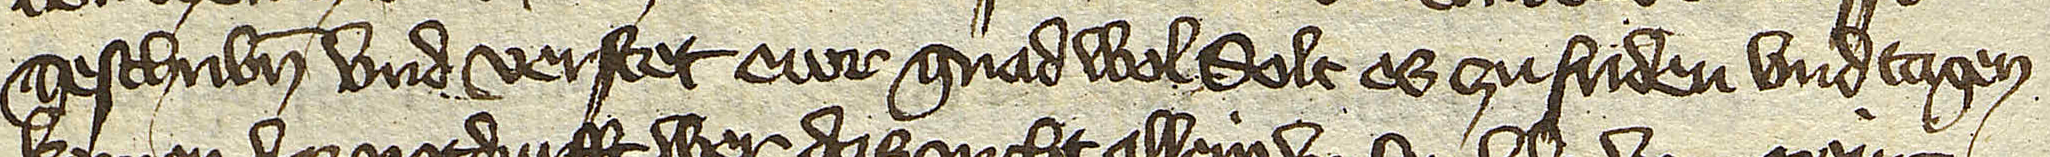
geſchribn* vnd verſtet ewr gnad wol Solt es cʒu friden vnd tagen
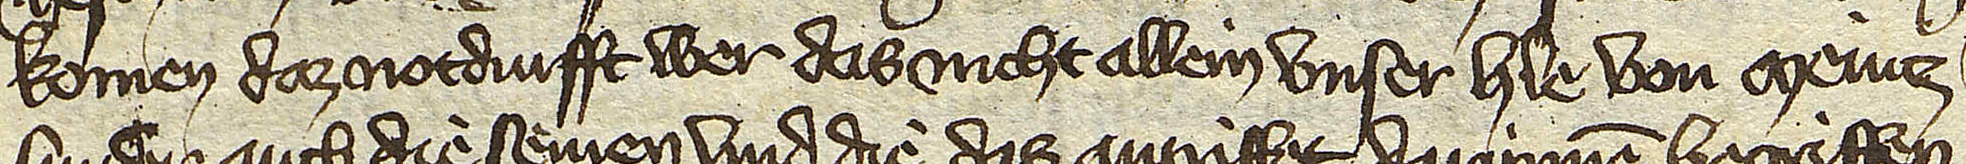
komen daʒ notdurfft wer das nicht allein vnſer h*re von Meincʒ
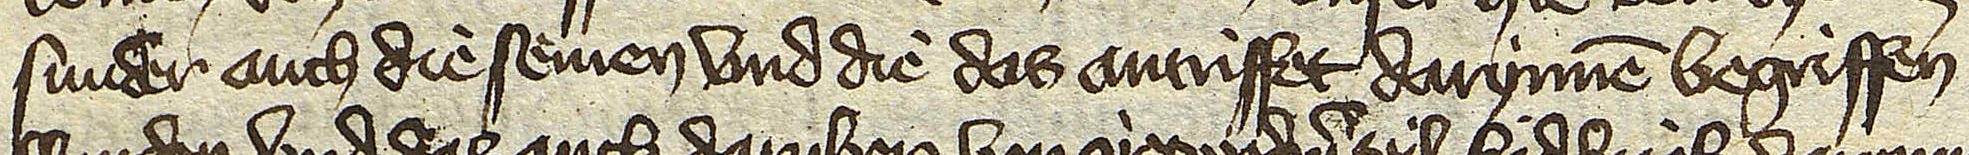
ſunder auch die ſeinen vnd die das antriffet darynne* begriffen
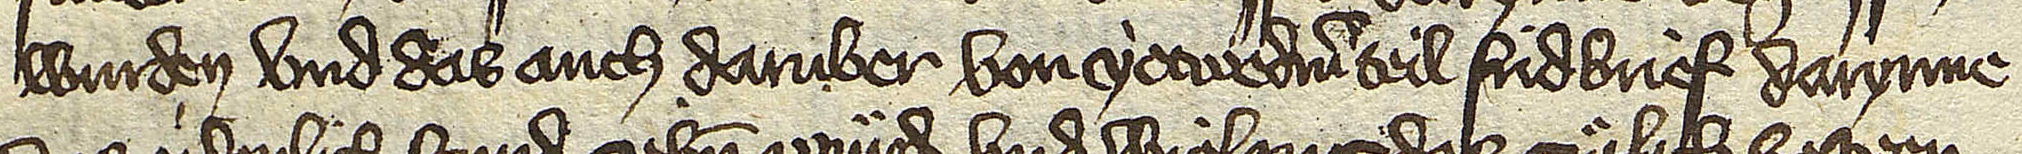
wurden vnd das auch daruber von yetwedm* teil frid brief darynne
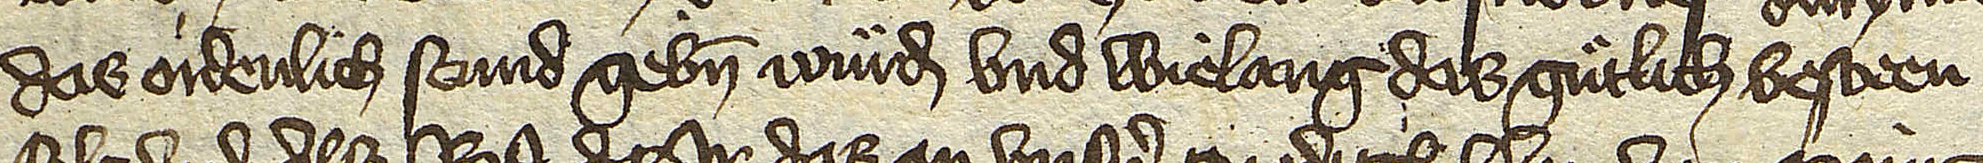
das ordenlich ſtund gebn* würd* vnd wielang das gütlich beſteen
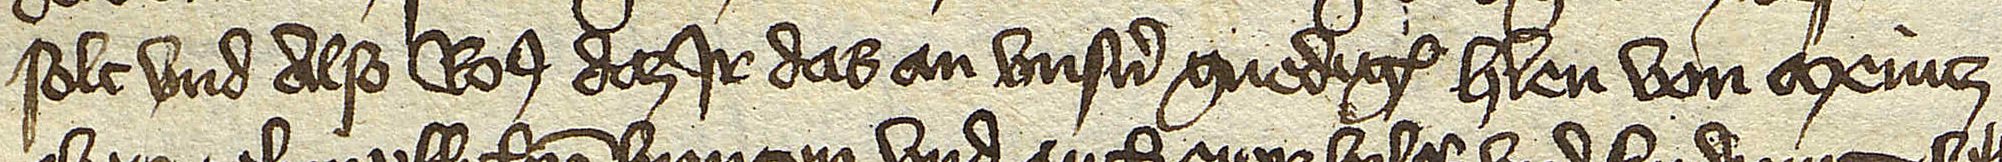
ſolt vnd Alſo Ro* daʒ Ir das an vnſn* gnedig* h*ren von Meincʒ
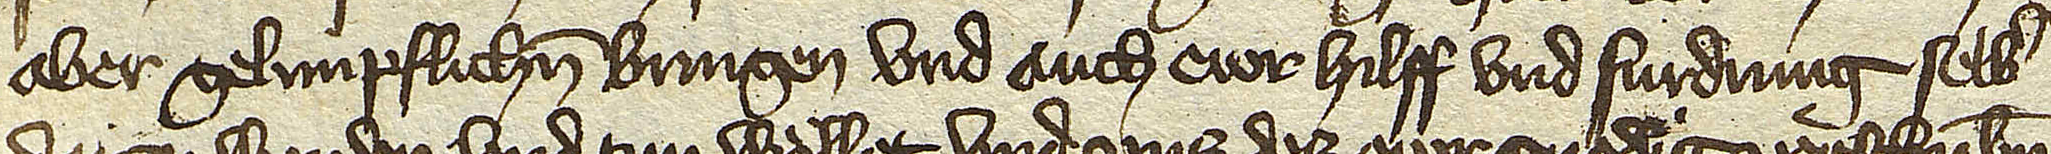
aber gelimpflichn* bringen vnd auch ewr hilff vnd furdrung ſelb*
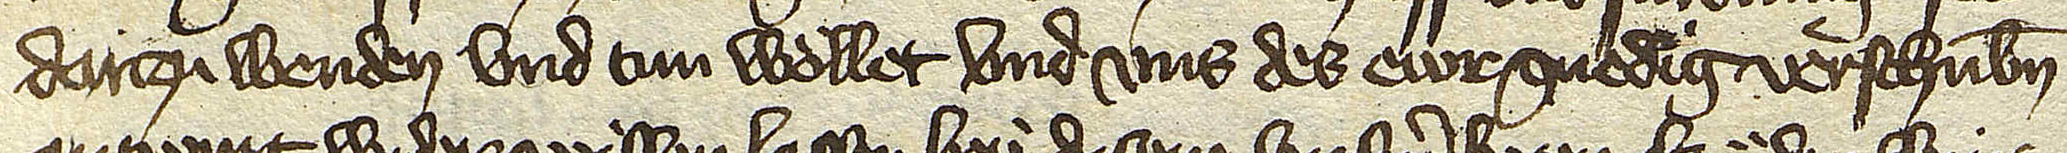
darcʒu wenden vnd tun wöllet vnd vns des ewr gnedig verſchribn*
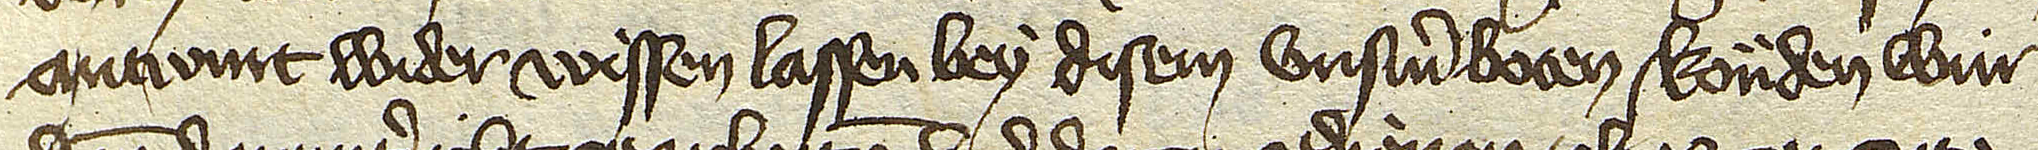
antwurt wider wiſſen laſſen bey diſem vnſm* boten / könden wir
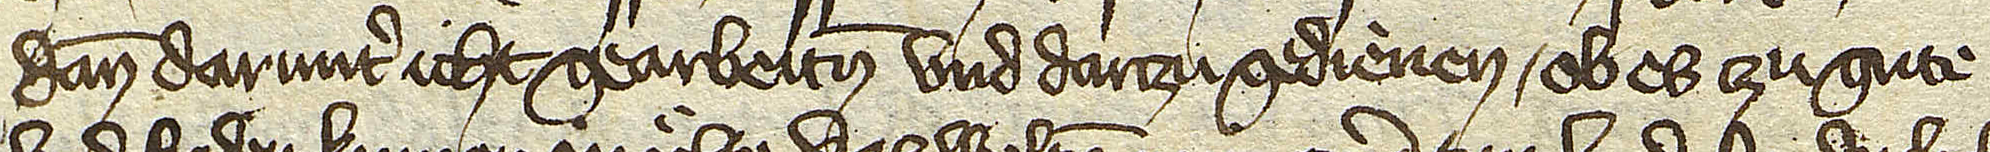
dan* darunt* icht gearbeitn* vnd darcʒu gedienen / ob es cʒu gute
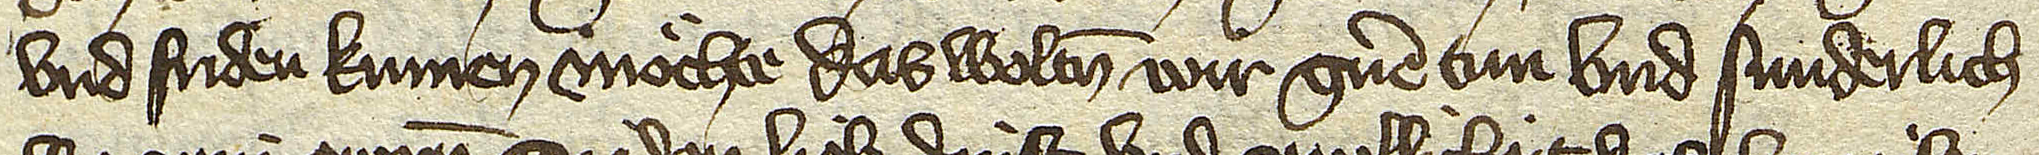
vnd friden kumen möchte das woltn* wir gne* tun vnd ſunderlich
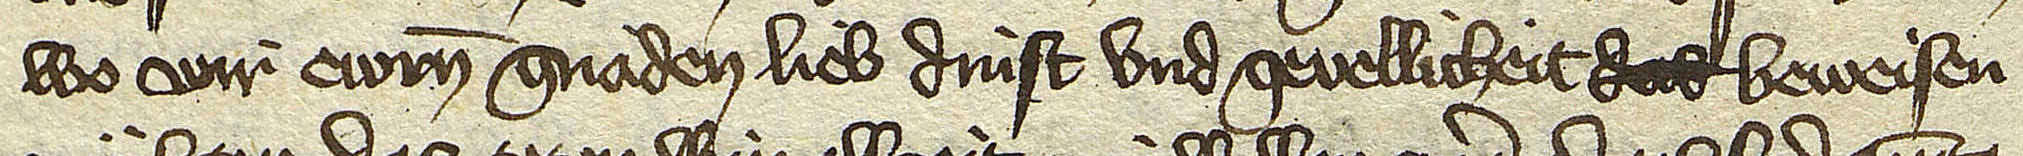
wo wor ewrn* gnaden lieb dinſt vnd gevellicheit das beweiſen
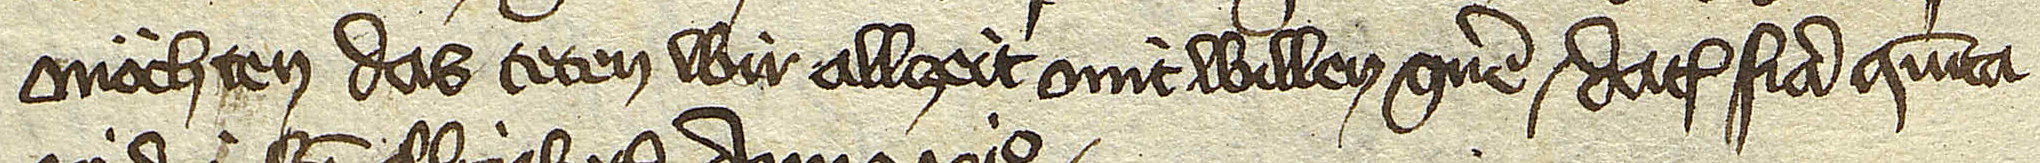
möchten das teten wir allcʒeit mit willen gne* / dat* fia* quta*
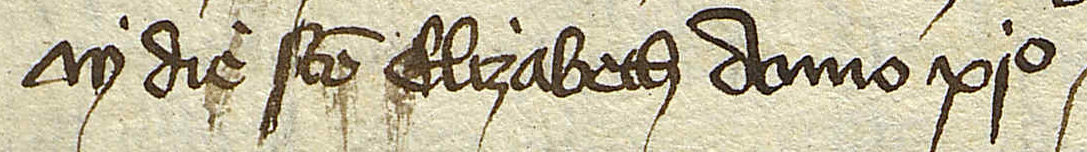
in die ſce* Eliʒabeth Anno xi* /
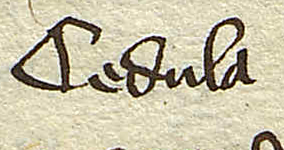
Cedula
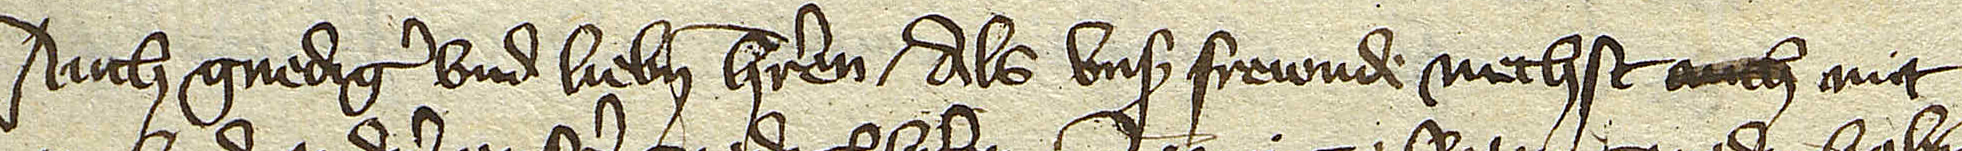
Auch gnedig* vnd liebn* hr*en / Als vnſ* frewnde nechſt auch mit
